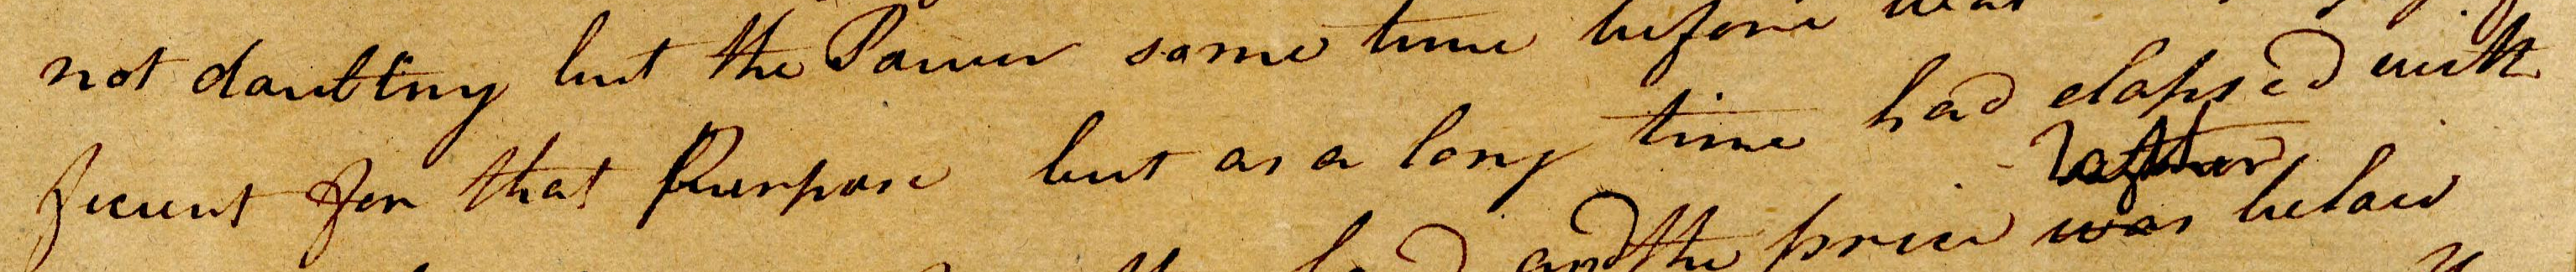ficient for that Purpose but as a long time had elapsed with
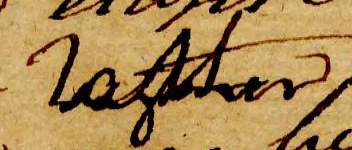rather
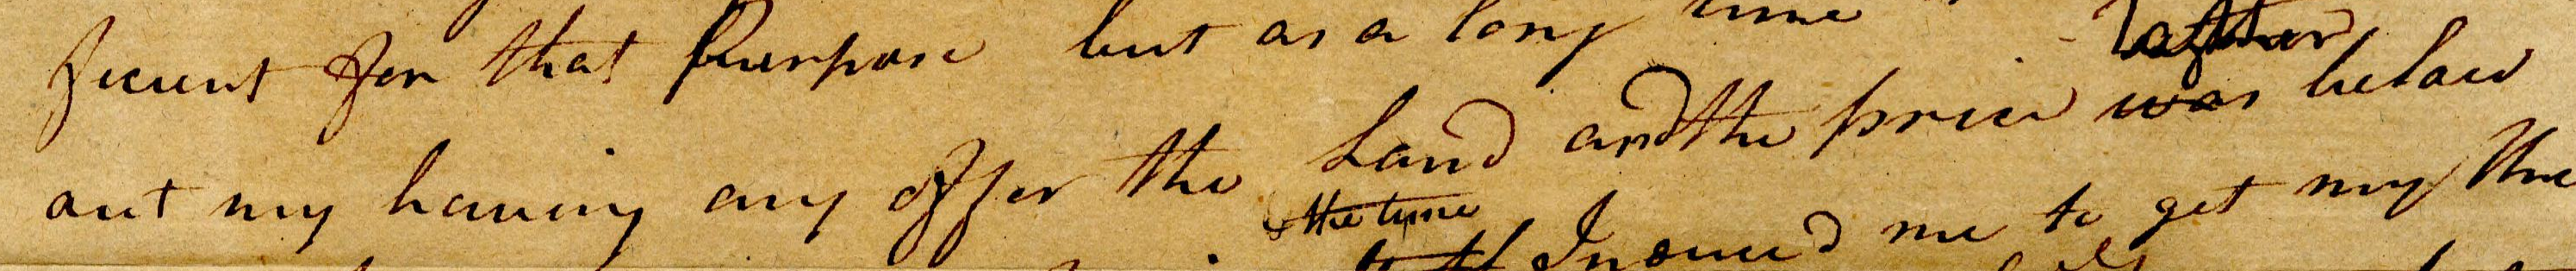out my having any offer the Land and the price [was] be laid
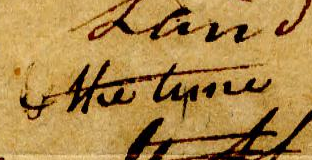the time
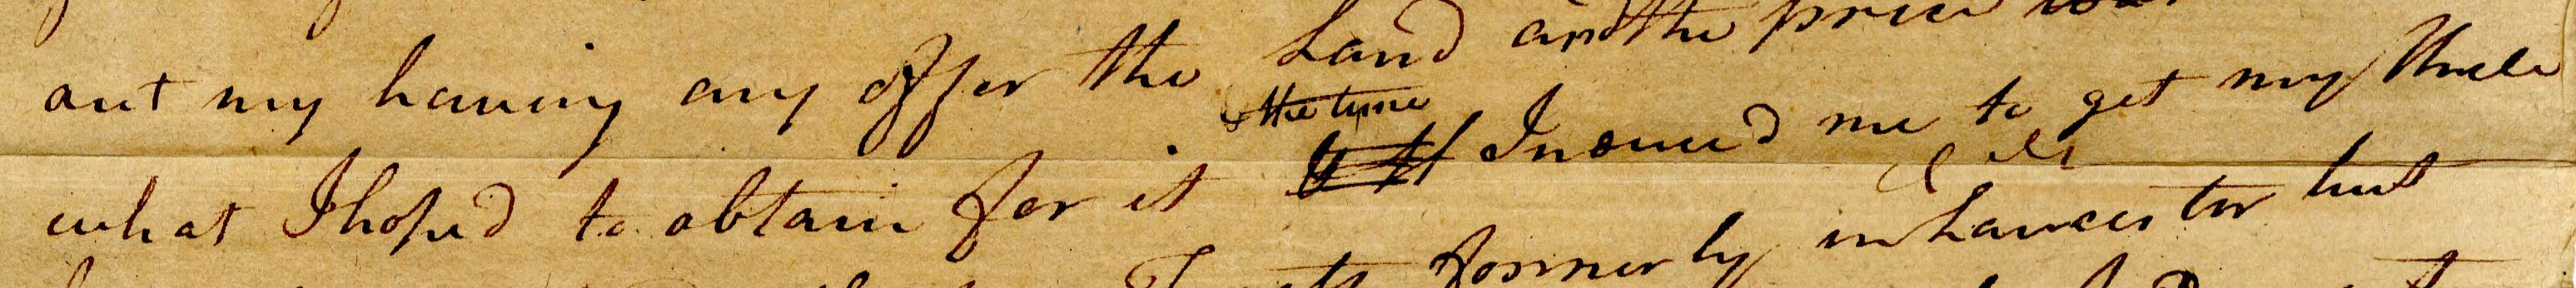what I hoped to obtain for it [& It] Induced me to get my Uncle
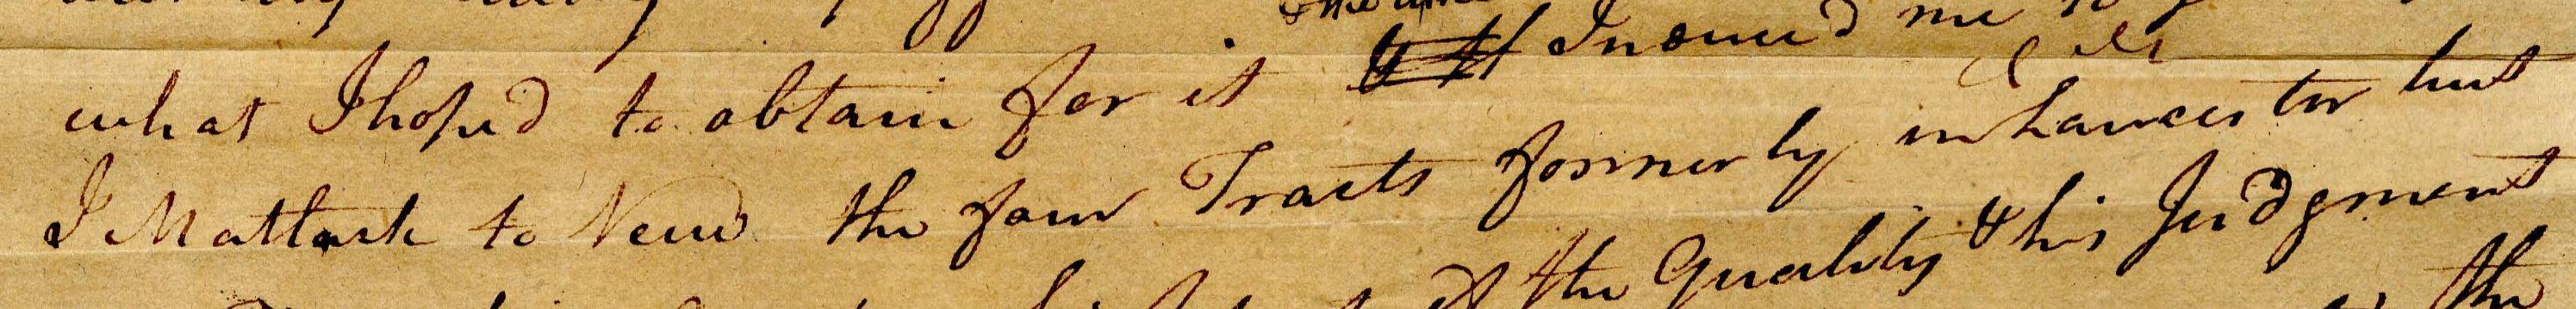& Matlack to Veiw the four Tracts formerly in Lancaster but
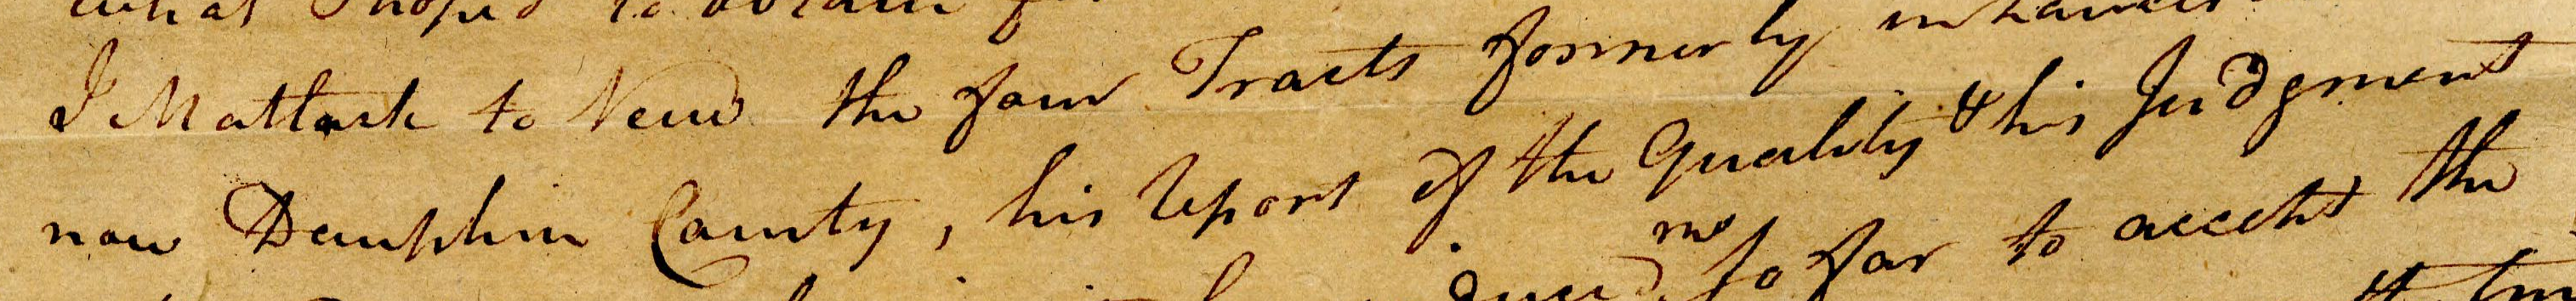now Dauphin County, his report of the Quarterly & his Judgement
